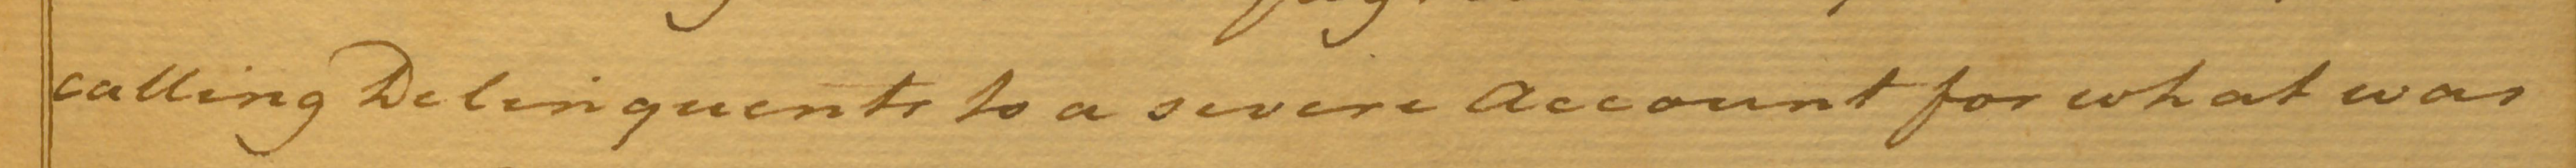calling Delinquents to a severe Account for what was
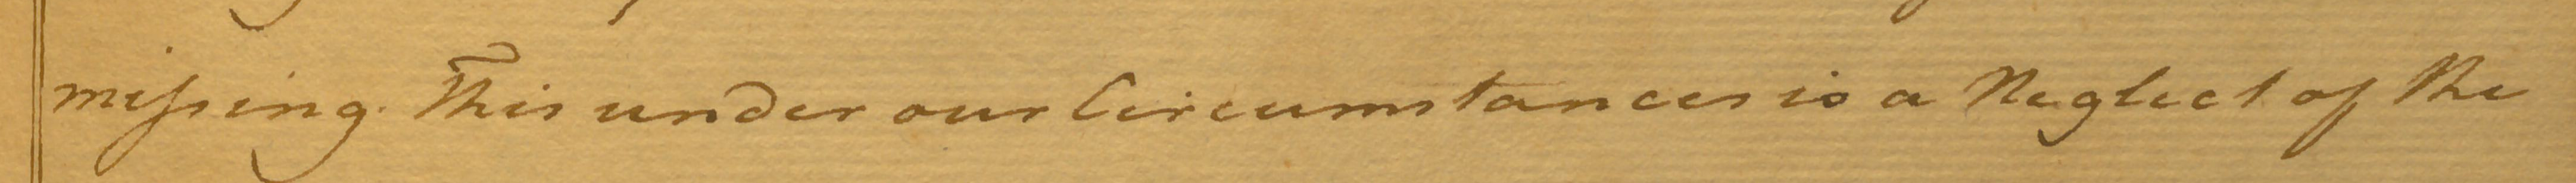missing. This under our Circumstances is a Neglect of the
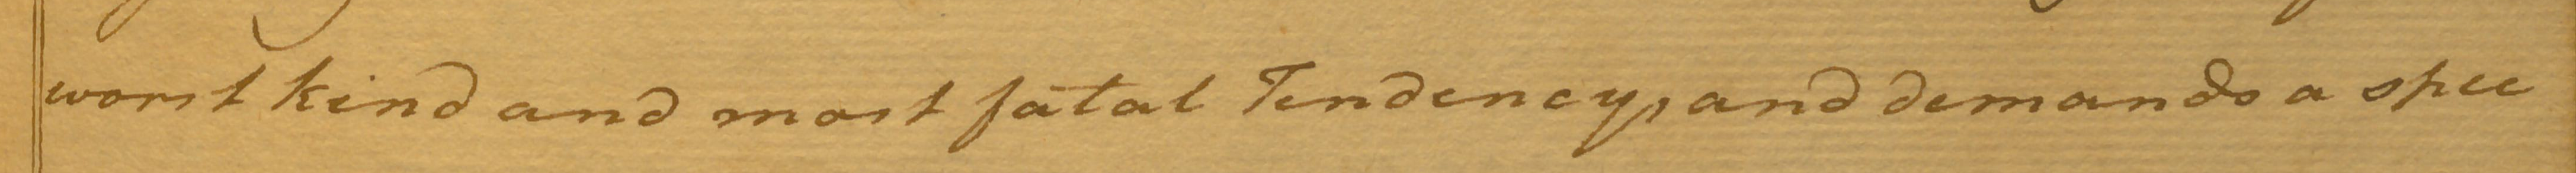worst kind and most fatal Tendency, and demands a spee
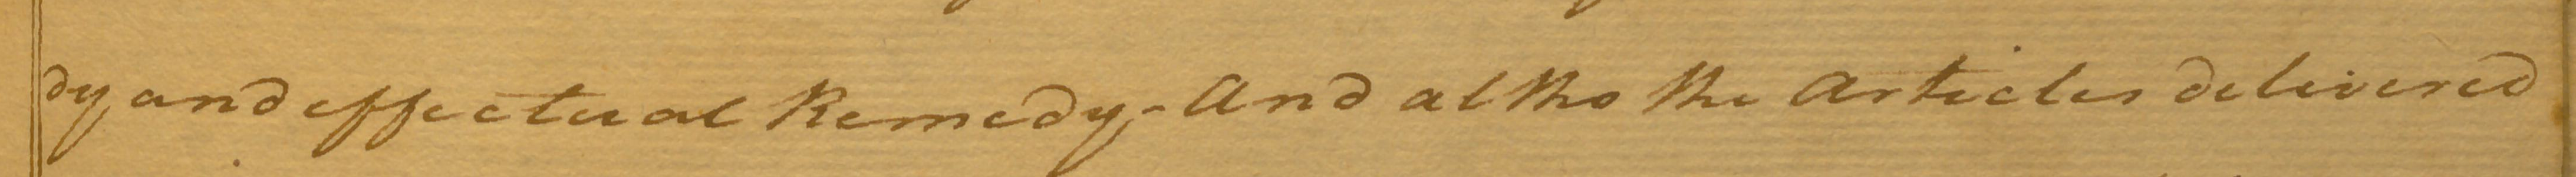dy and effectual Remedy. And altho the Articles delivered
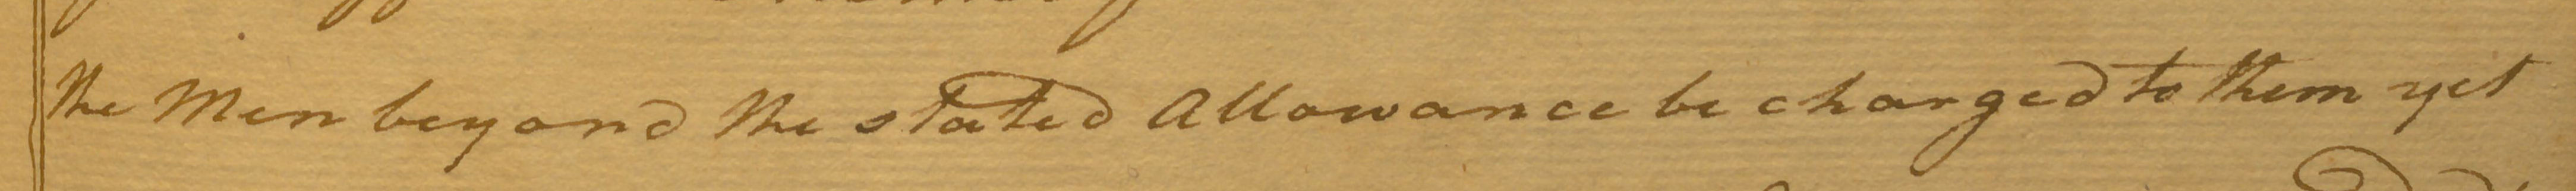the Men beyond the stated Allowance be charged to them yet
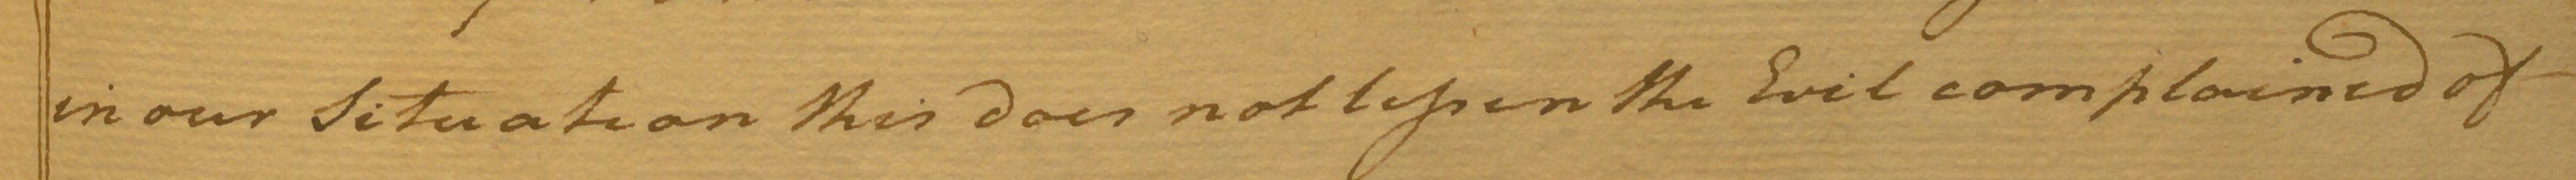in our Situation this does not lessen the Evil complained of
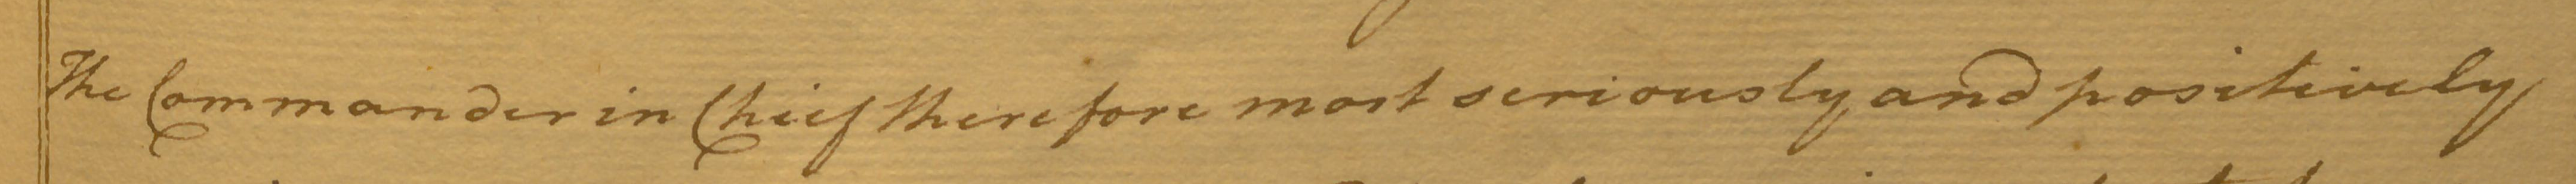The Commander in Chief therefore most seriously and positively
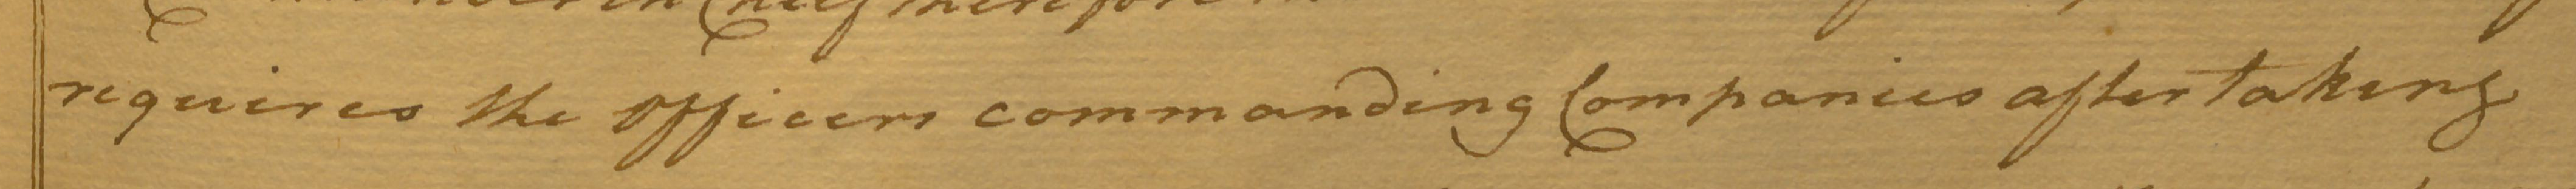requires the Officers commanding Companies after taking
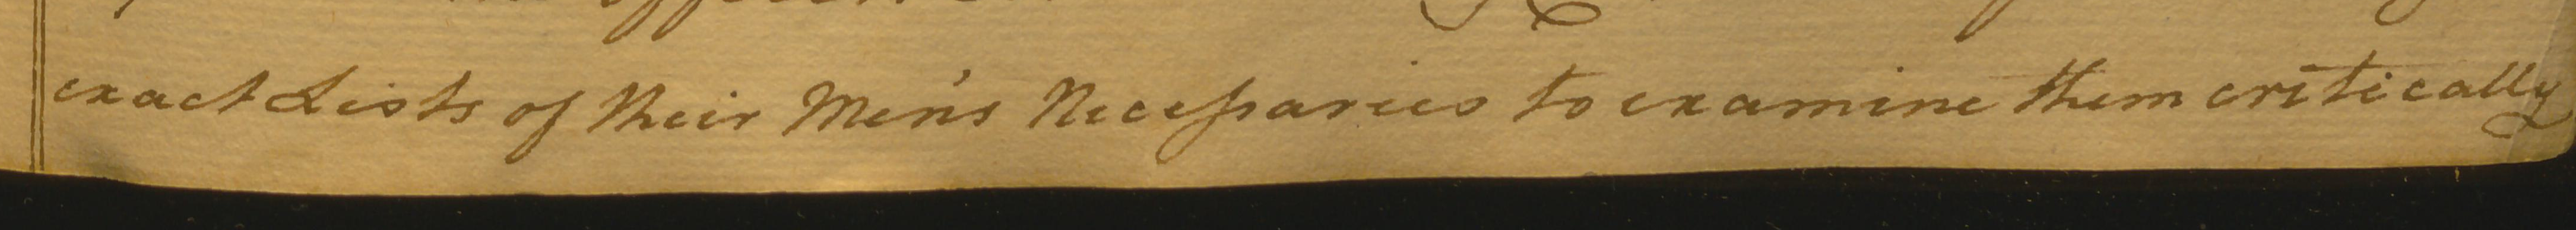exact Lists of their Men's Necessaries to examine them critically
